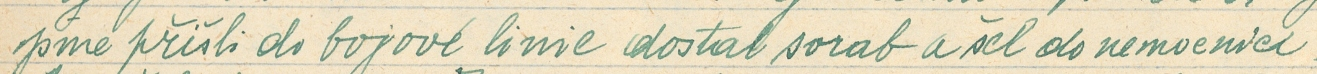jsme přišli do bojové linie dostal svrab a šel do nemocnice.
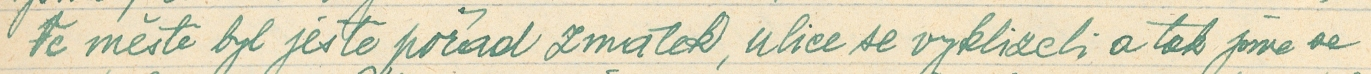Ve městě byl ještě pořád zmatek, ulice se vyklizeli a tak jsme se
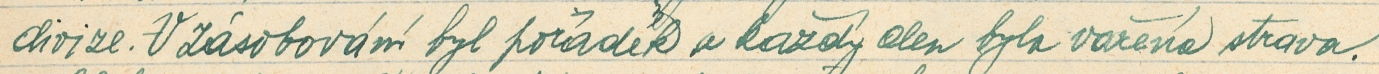divize. V zásobování byl pořádek a každý den byla vařená strava.
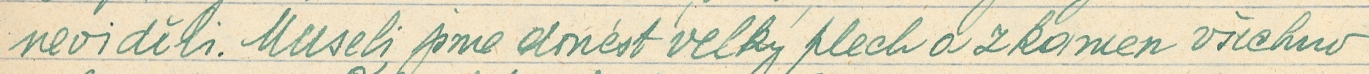neviděli. Museli jsme donést velký plech a z kamen všechno
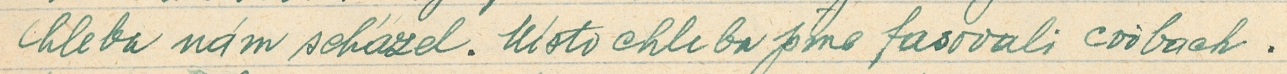Chleba nám scházel. Místo chleba jsme fasovali cvibach.
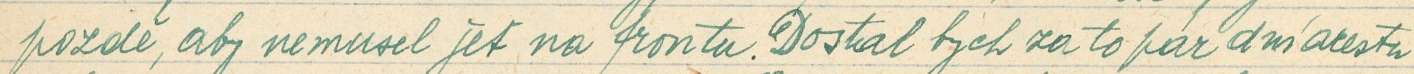pozdě, aby nemusel jet na frontu. Dostal bych za to pár dní arestu
